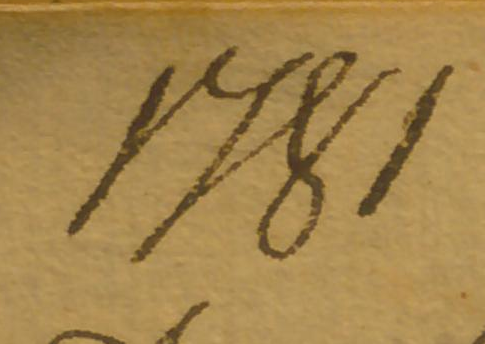1781
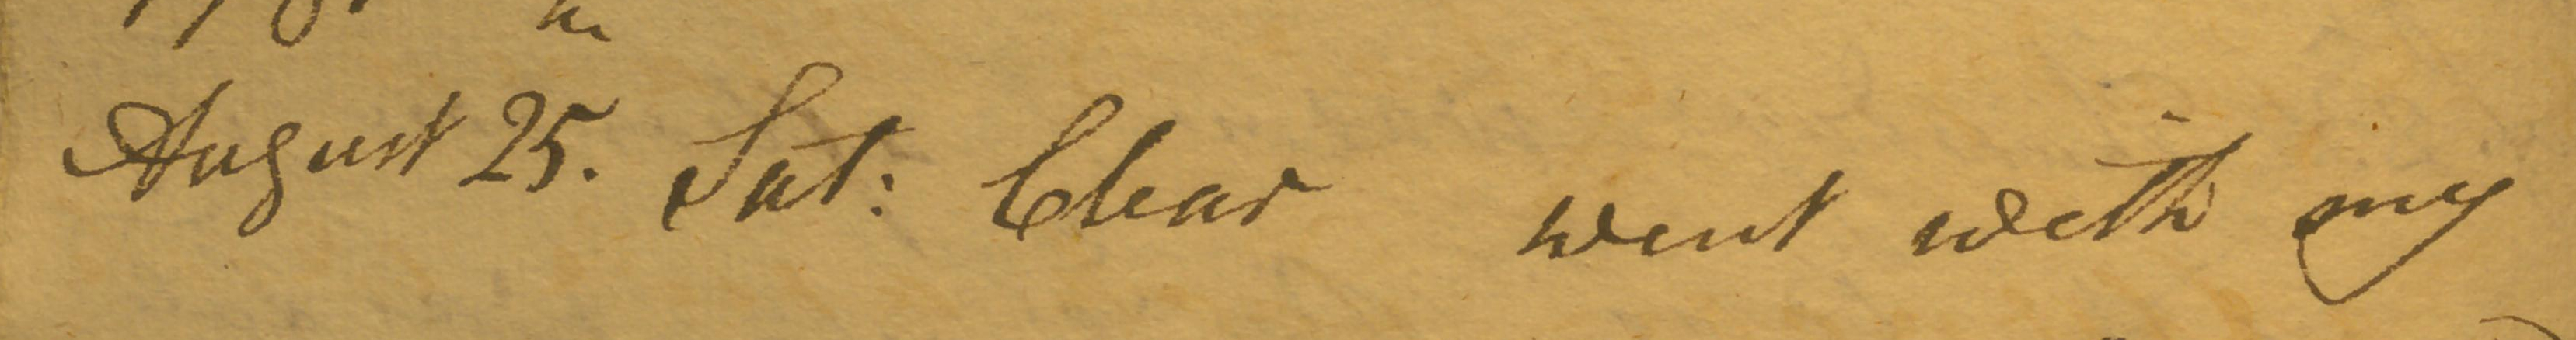August 25^th. Sat: Clear went with my
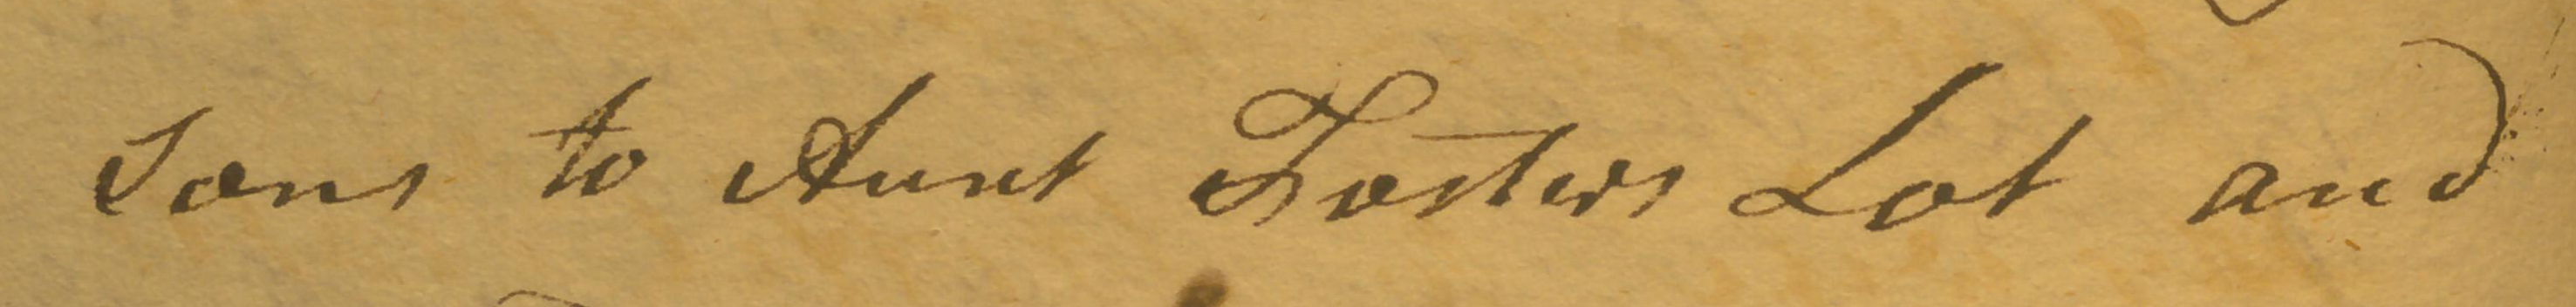Sons to Aunt Fusters Lot and
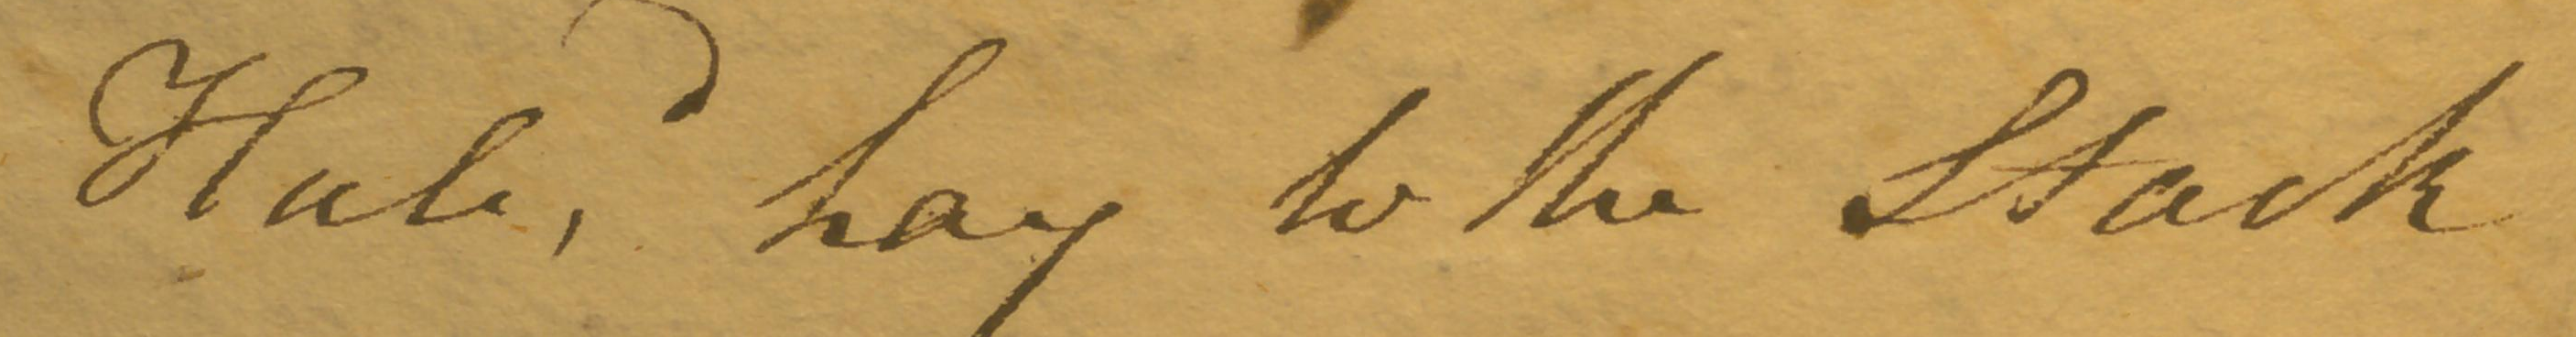Hale^d, hay to the Stack
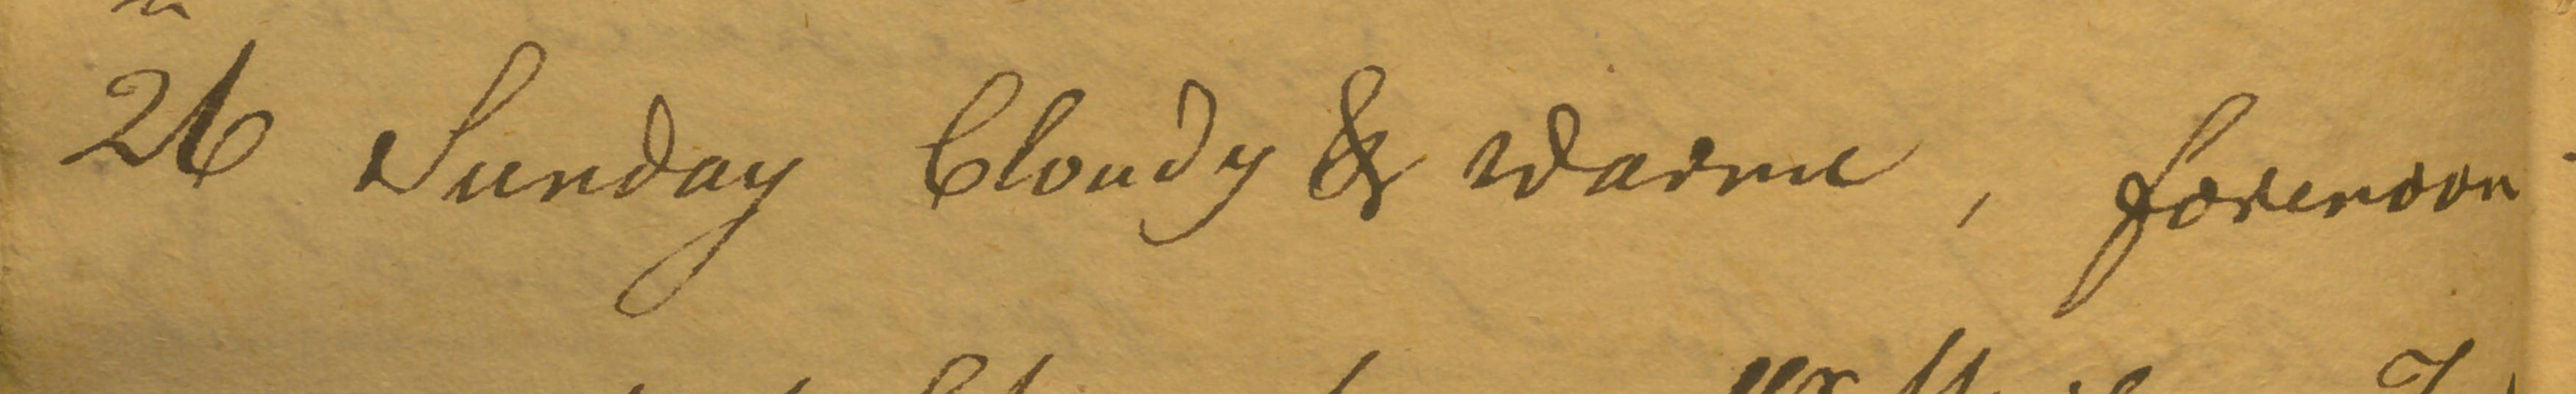26. Sunday Cloudy & warme, forenoon
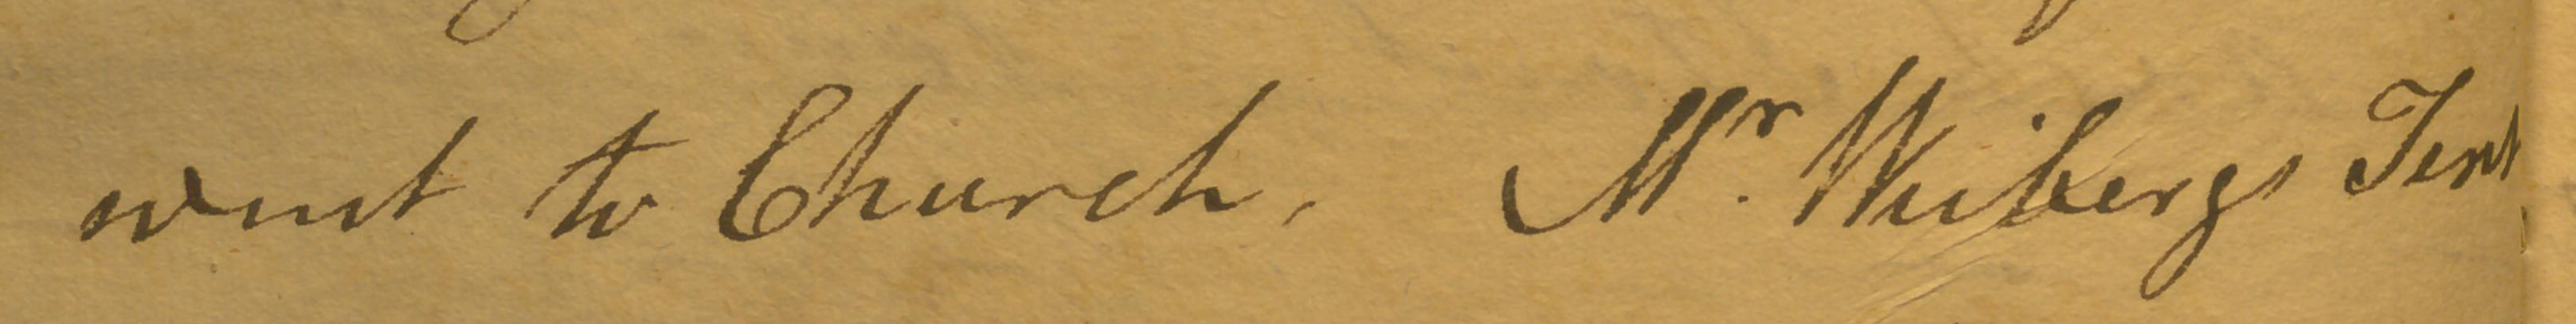went to Church, M^r. Weibergs Text
